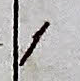1
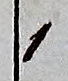1
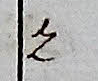2
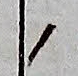1
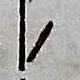1
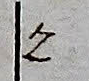2
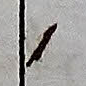1
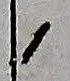1
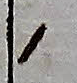1
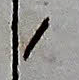1
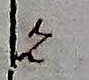2
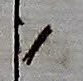1
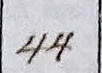44
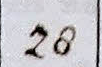28
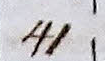41
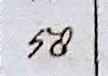58
